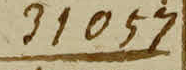31057
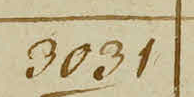3031
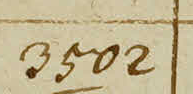3502
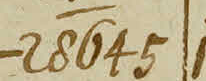28645
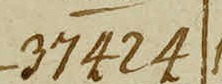37424
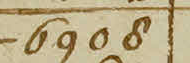6908
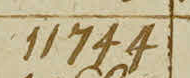11744
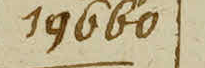19660
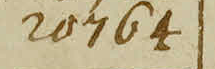20764
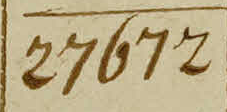27672
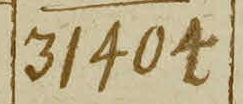31404
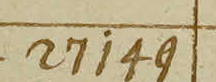27149
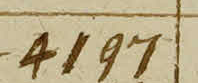4197
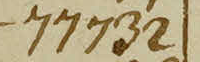77732
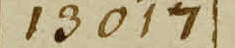13017
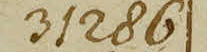31286
